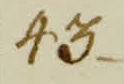43
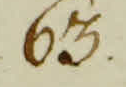63
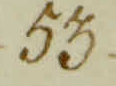53
